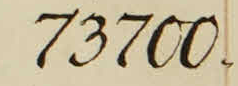73700
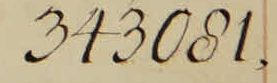343081
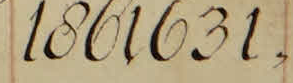1861631
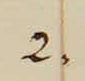2
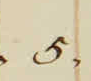5
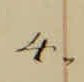4
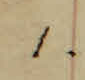1
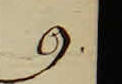9.
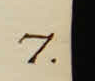7.
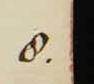8.
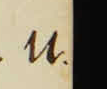11.
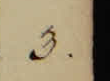3.
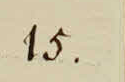15.
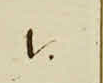1.
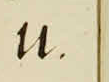11.
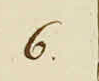6.
